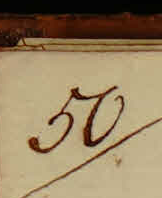50
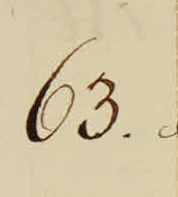63.
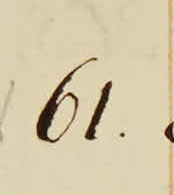61.
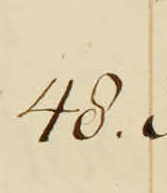48.
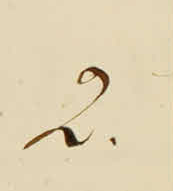2.
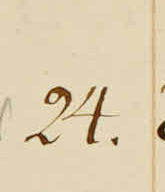24.
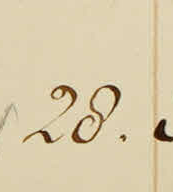28.
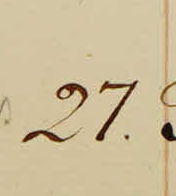27.
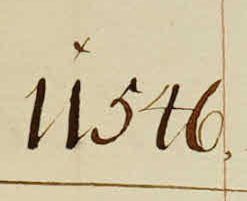11546
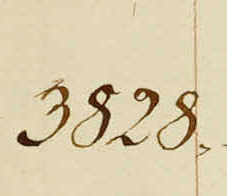3828
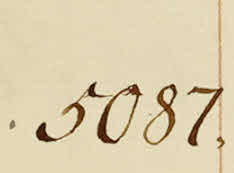5087
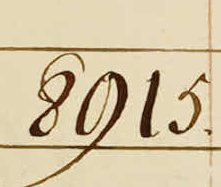8915
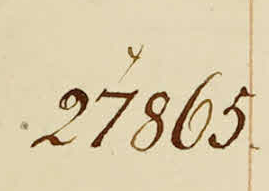27865
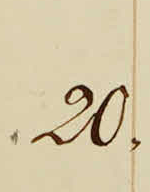20
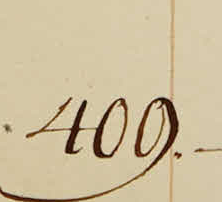409.
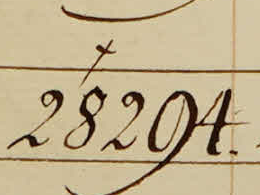28294
